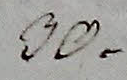30
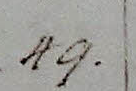49.
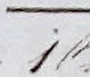1
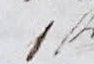12
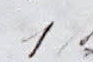1
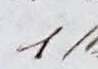1
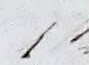1
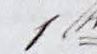1
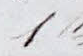1
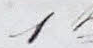1
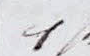1
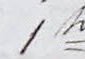1
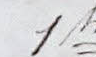1
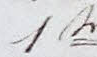1
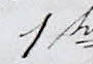1
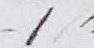1
